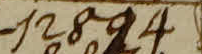12894
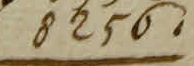8256
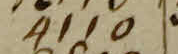4110
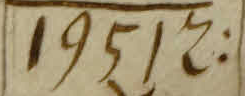19512:
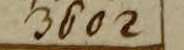3602
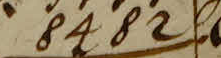8482
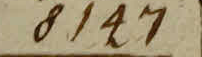8147
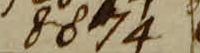8874
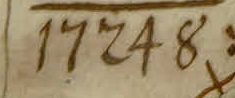17248
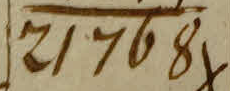21768
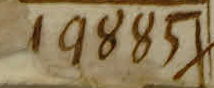19885
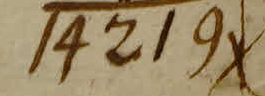14219
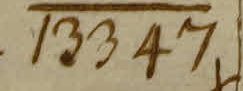13347
